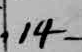14
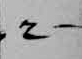2
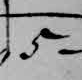5
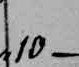10
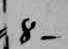8
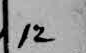12
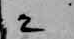2
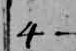4
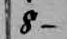8
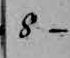8
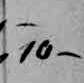10
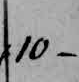10
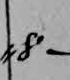8
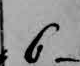6
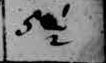5½
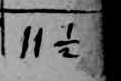11½
